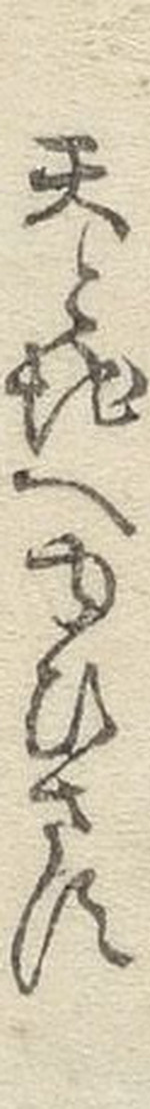天と地へゆひさす
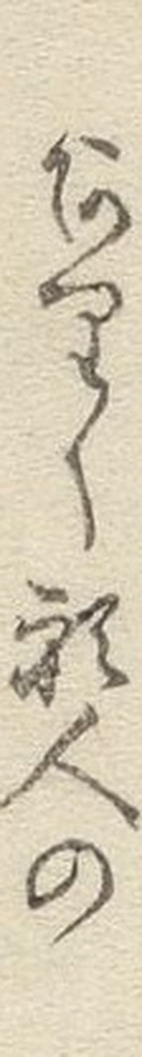ありく願人の
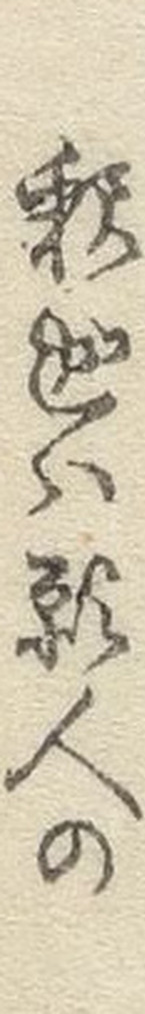釈迦は願人の
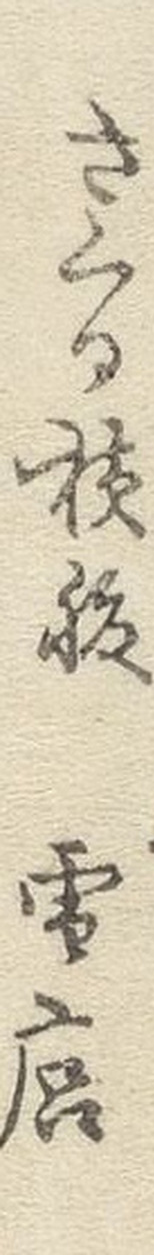さくる横腹雪麿
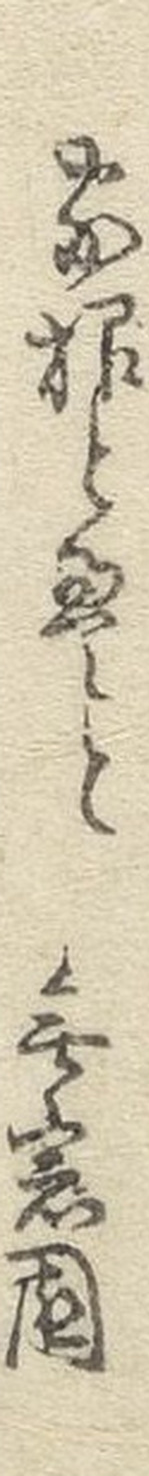家根と畳と無窓園
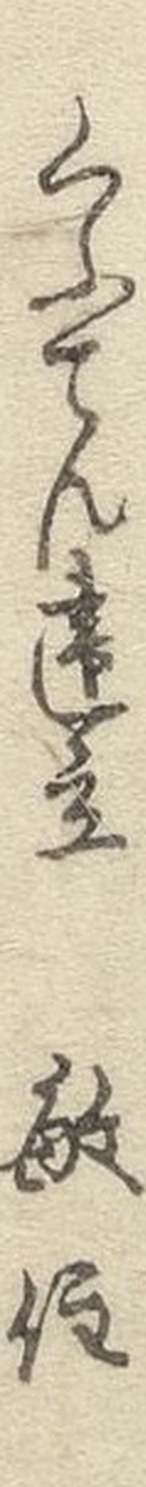くふてん建立敏住
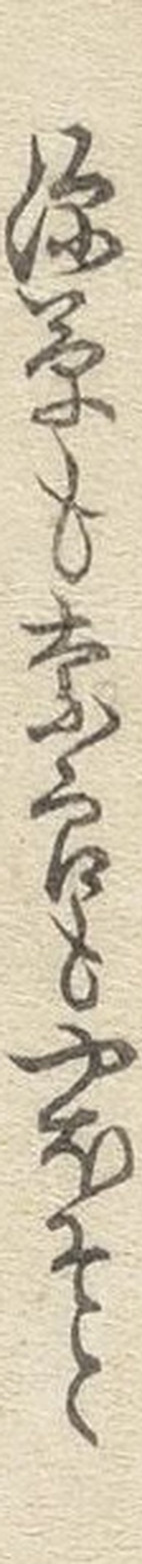深草もならもやほそと
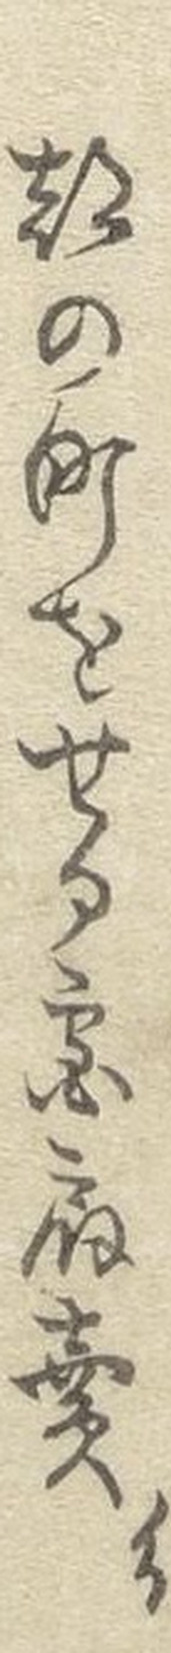都の町をせる団扇売
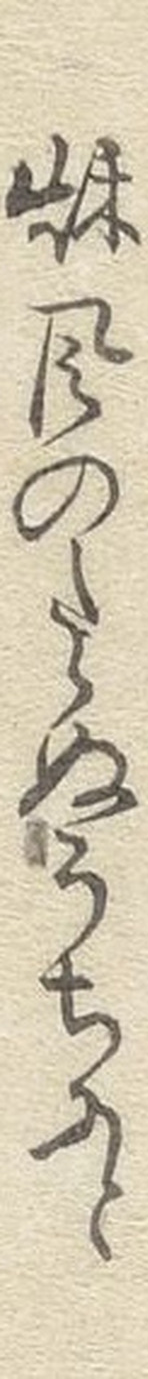秋風のたゝぬうちにと
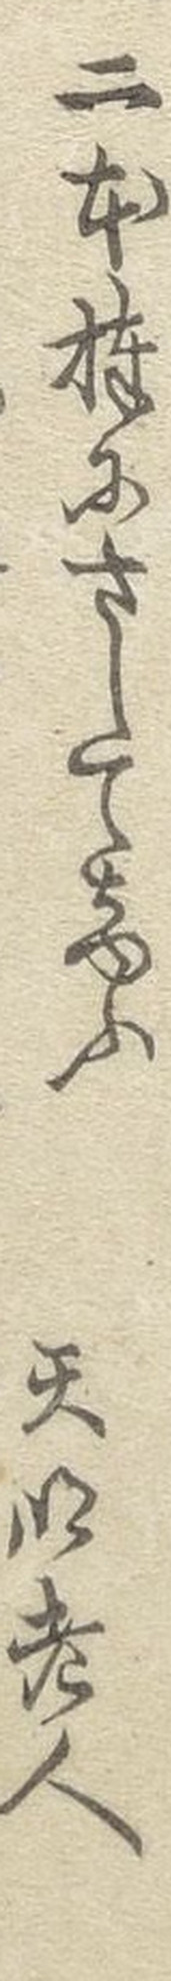二本棟にさして商ふ天明老人
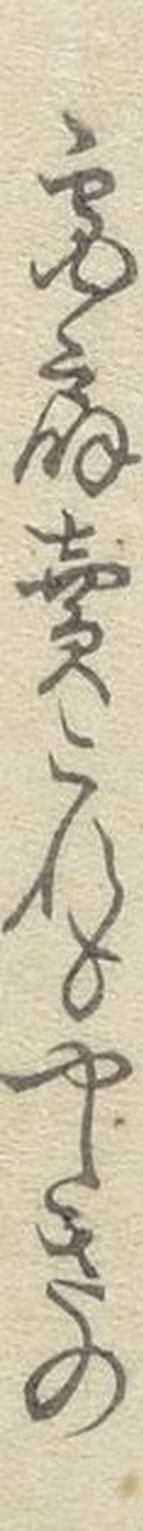団扇売これもやしきの
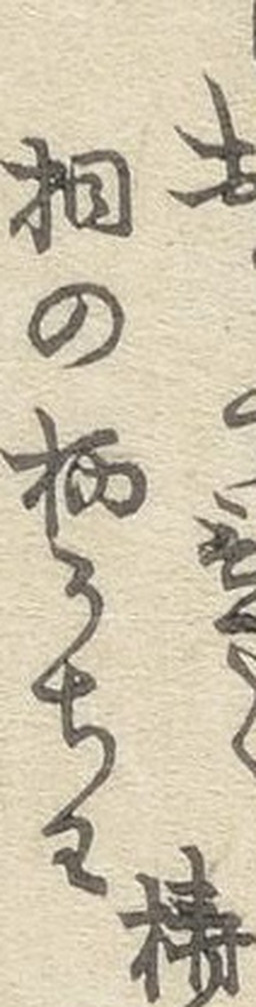桐の柄うちわ
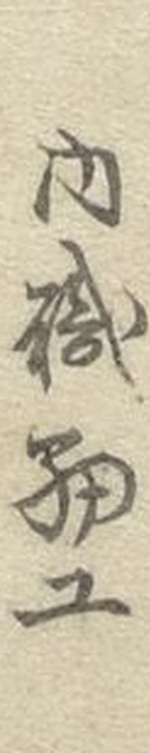内職細工
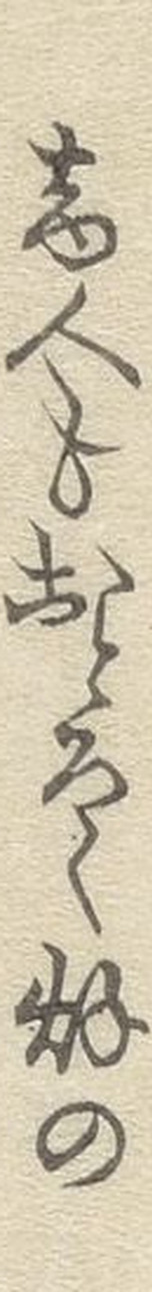商人もおとろく秋の
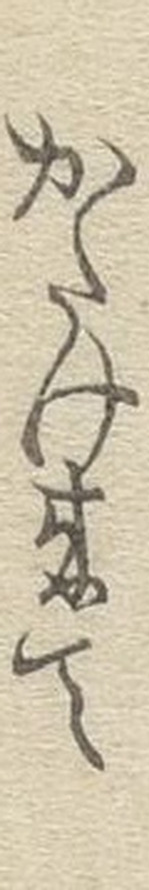かたけ来て
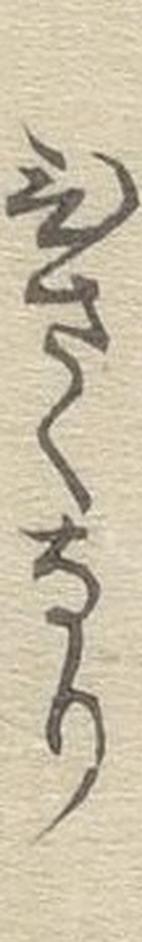ひさくなり
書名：Picture Album of People with Kyōka (Light Verse) (Kyōka shiki jinbutsu 狂歌四季人物)
